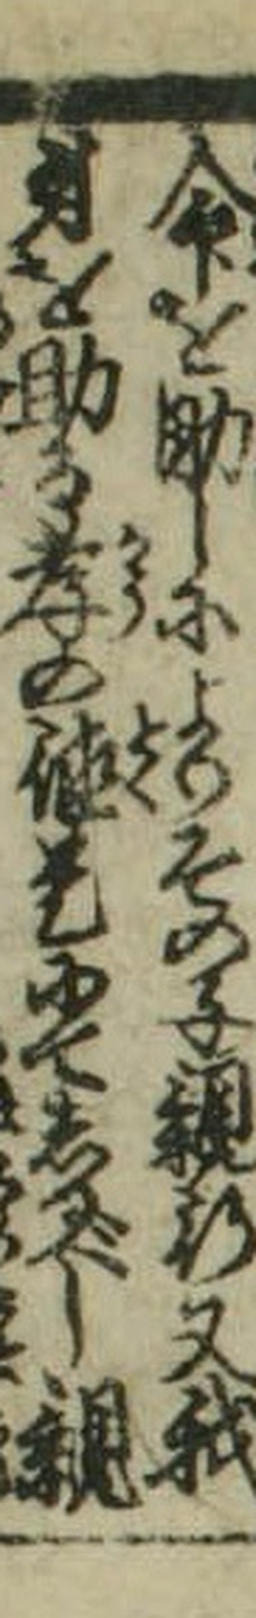命を助る孝の徳是にてしるべし親
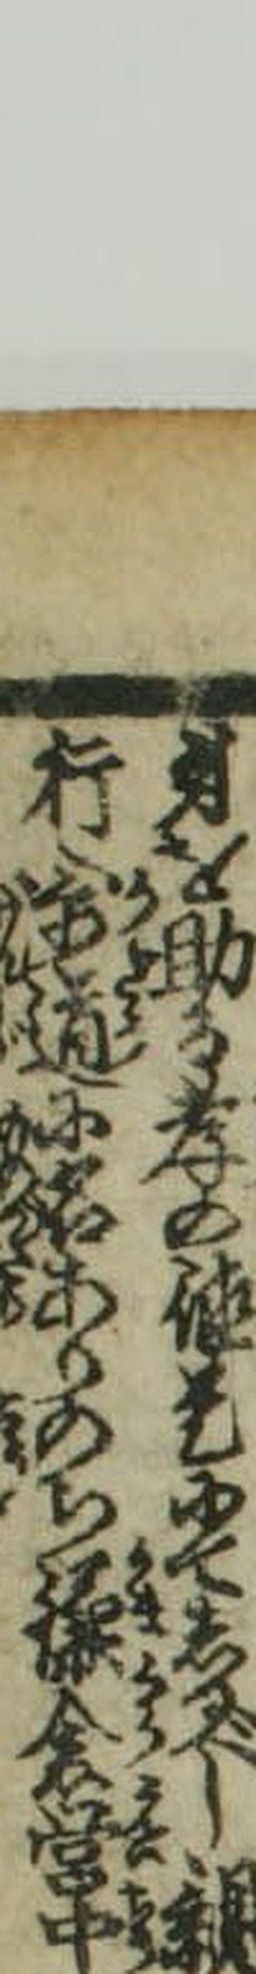行哥道に名ありのち鎌倉営中
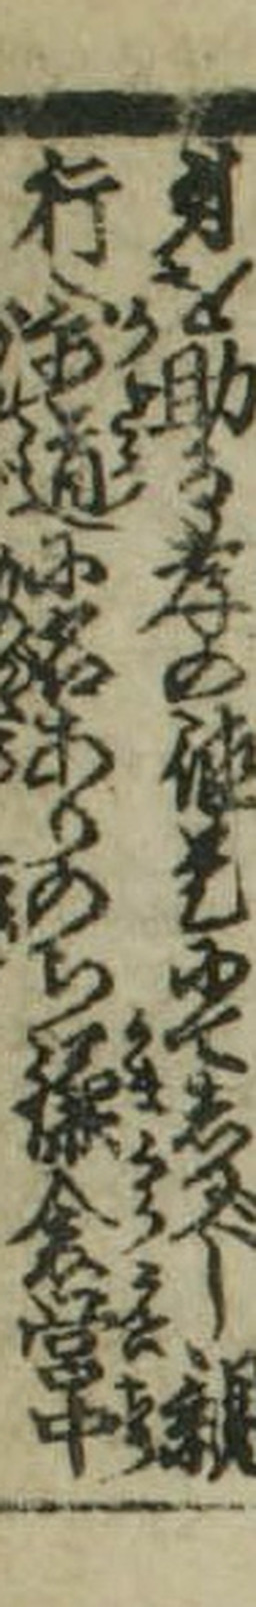行哥道に名ありのち鎌倉営中
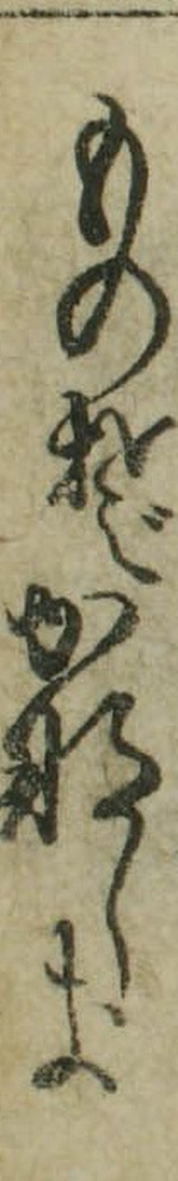ものぞかなしき
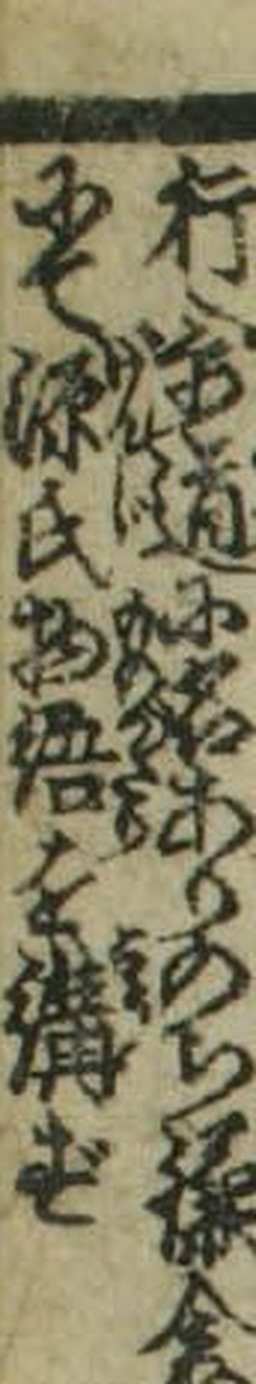にて源氏物語を講ず

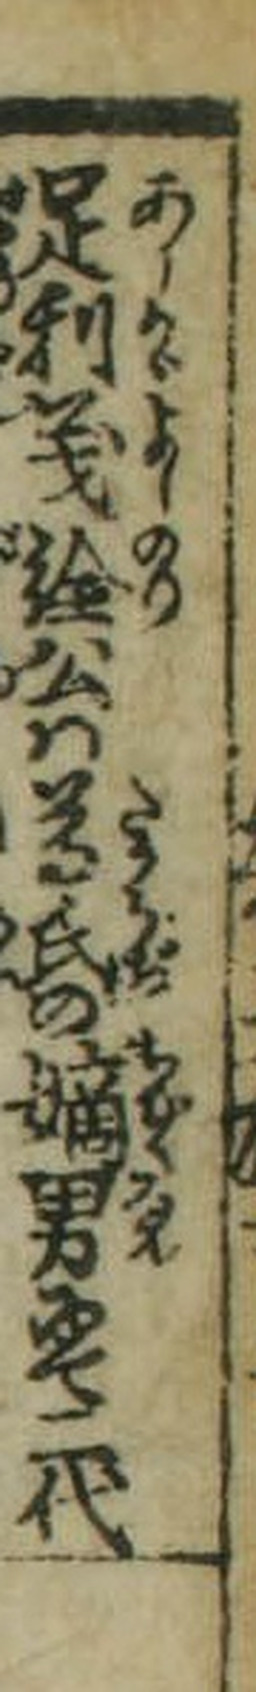足利義詮公は尊氏の嫡男にて二代
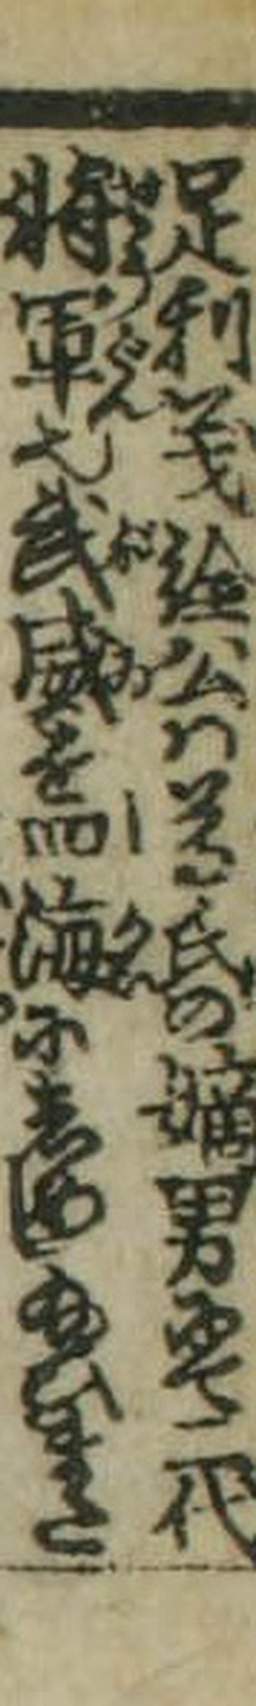将軍也武威を四海にしめし給ひまた
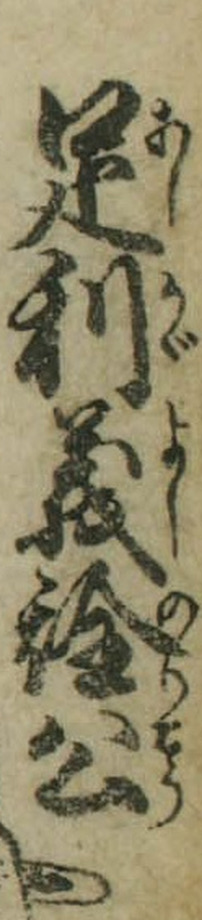足利義詮公
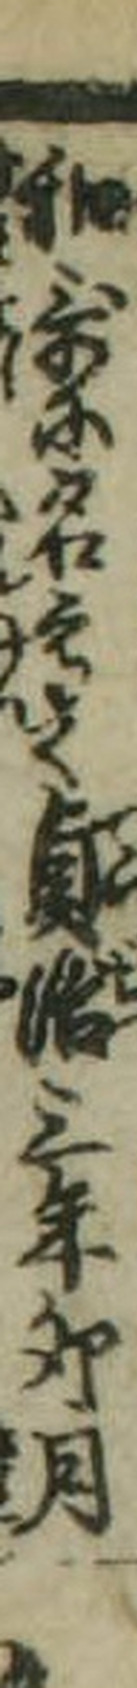和歌に名高く貞治三年卯月
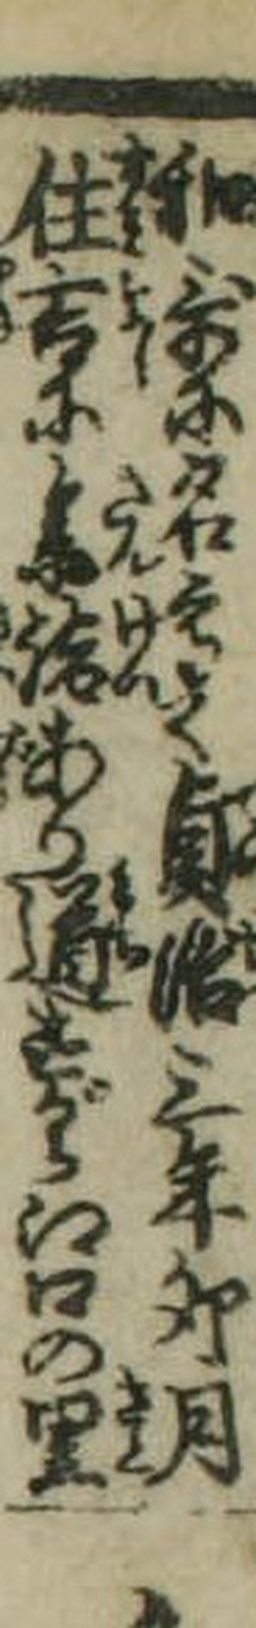住吉に参詣あり道すがら江口の里
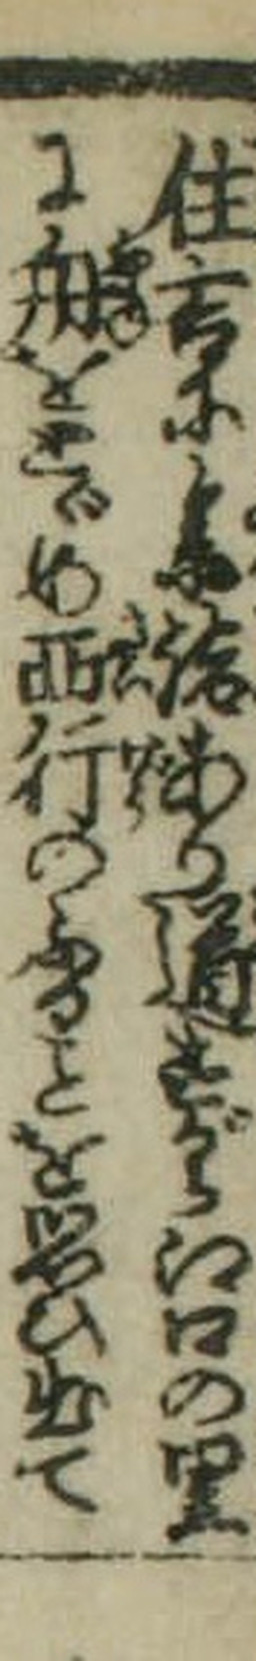に舟をとゞめ西行のふることを思ひ出て
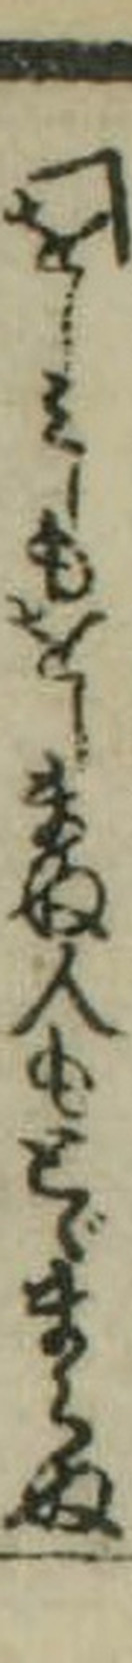〽をしみしもをしまぬ人もとゞまらぬ
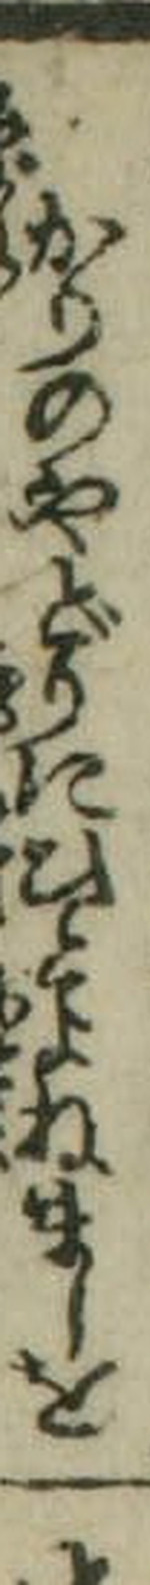かりのやどりにひとよねましを
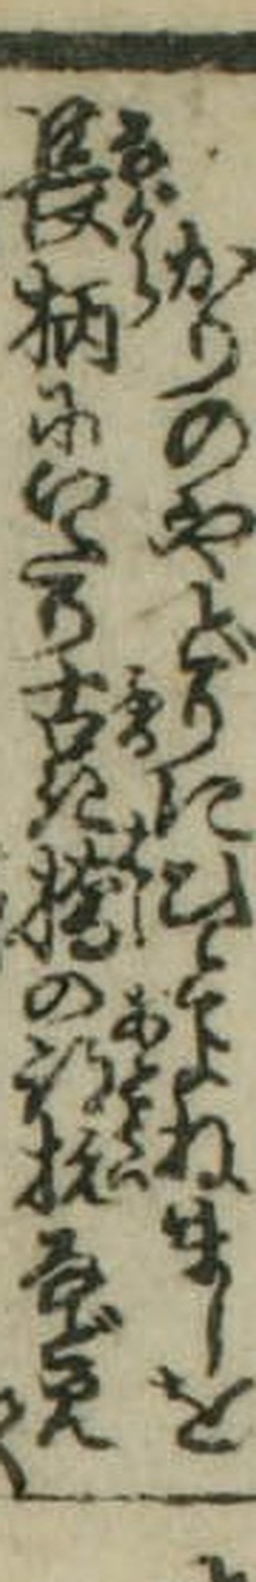長柄にいたり古き橋の跡杭など見て
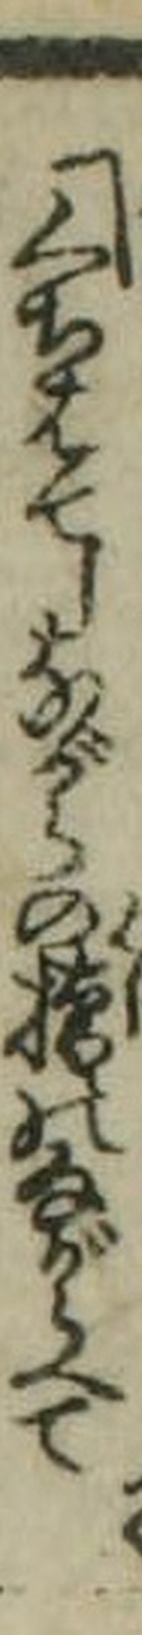〽くちはてしながらの橋のながらへて
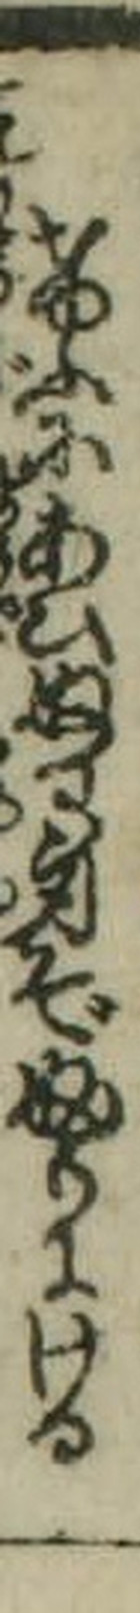けふにあひぬる身ぞふりにける
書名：續英雄百人一首
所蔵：東京学芸大学附属図書館
